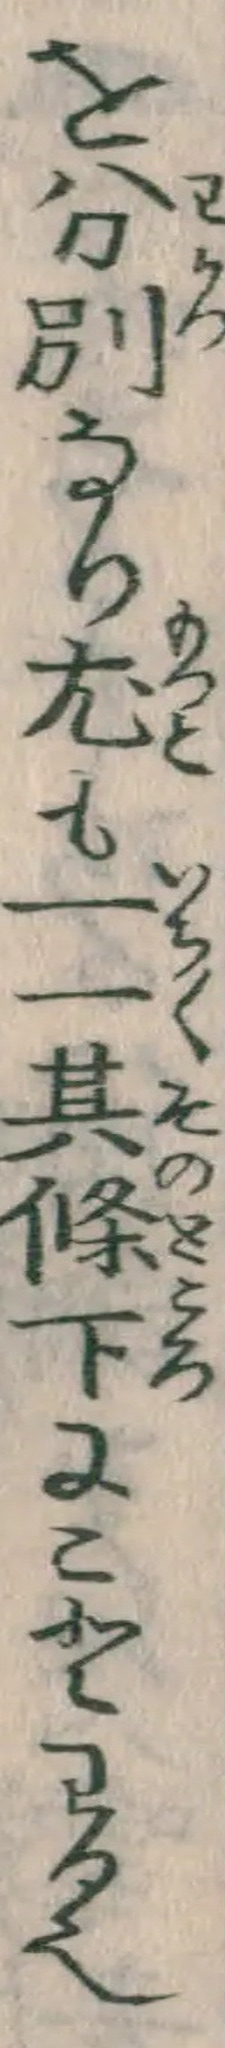を分別なり尤も一一其條下にことわる也
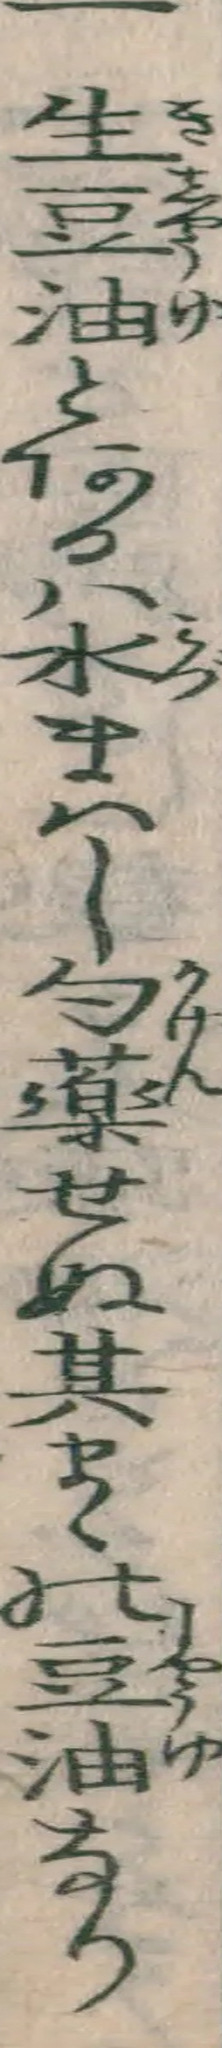一生豆油とあるは水まはし勺薬せぬ其まゝの豆油なり
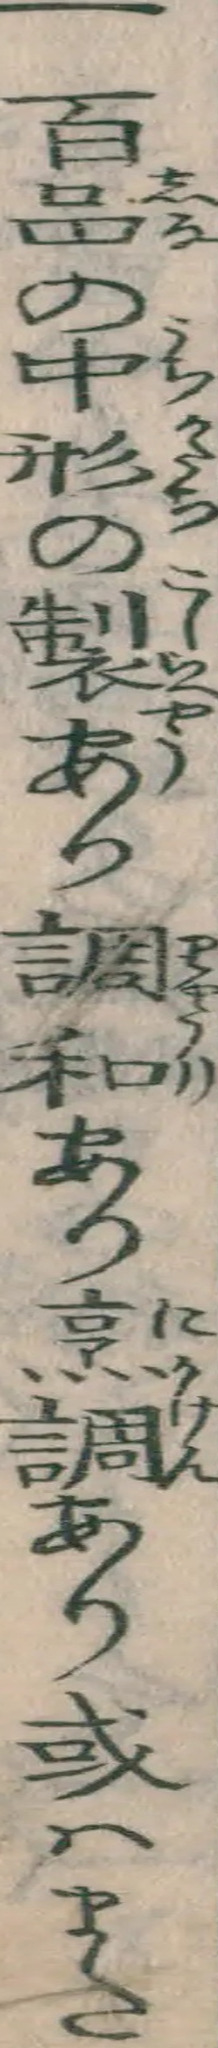一百品の中形の製あり調和あり烹調あり或はまた

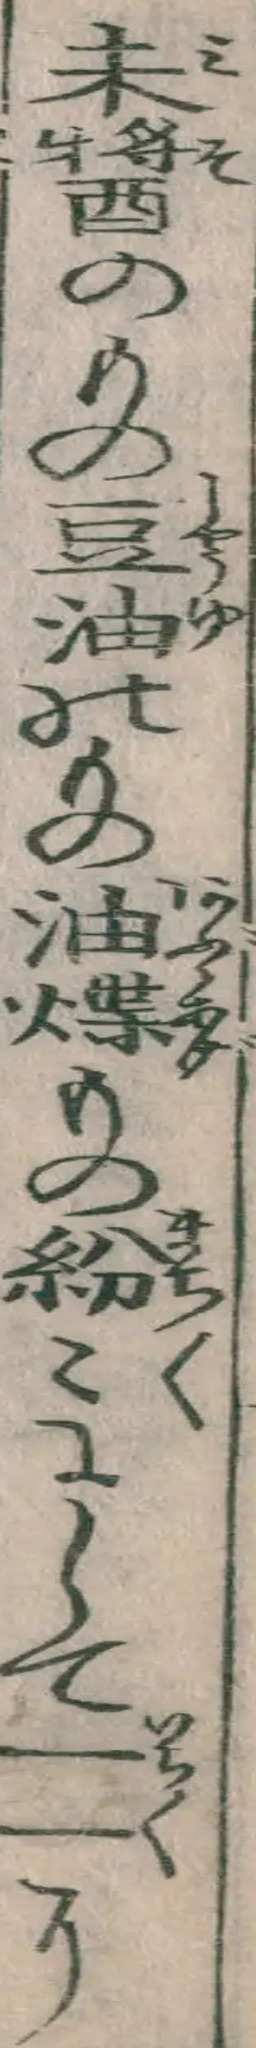未醤のもの豆油のもの油煠もの紛々にして一一に
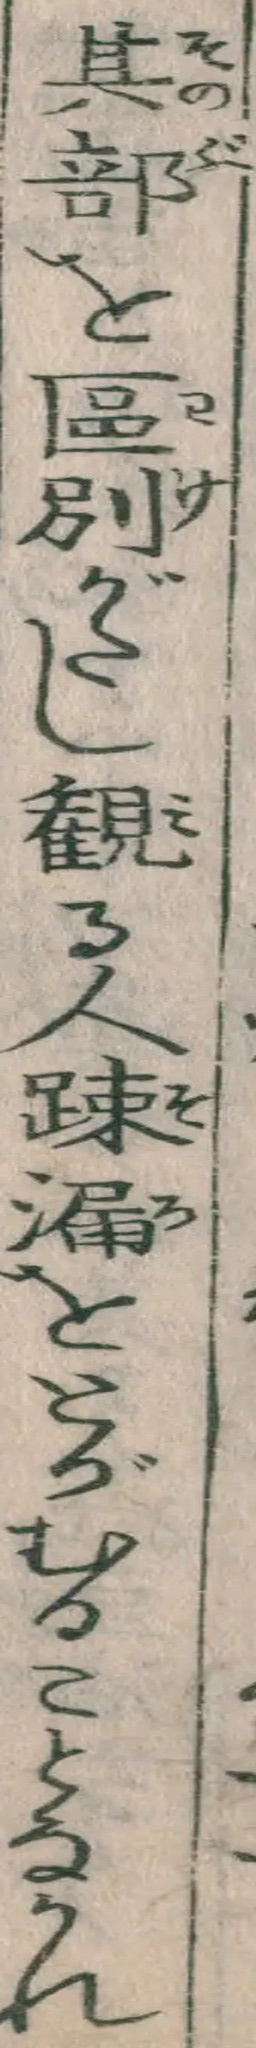其部を区別がたし観る人疎漏をとがむることなかれ
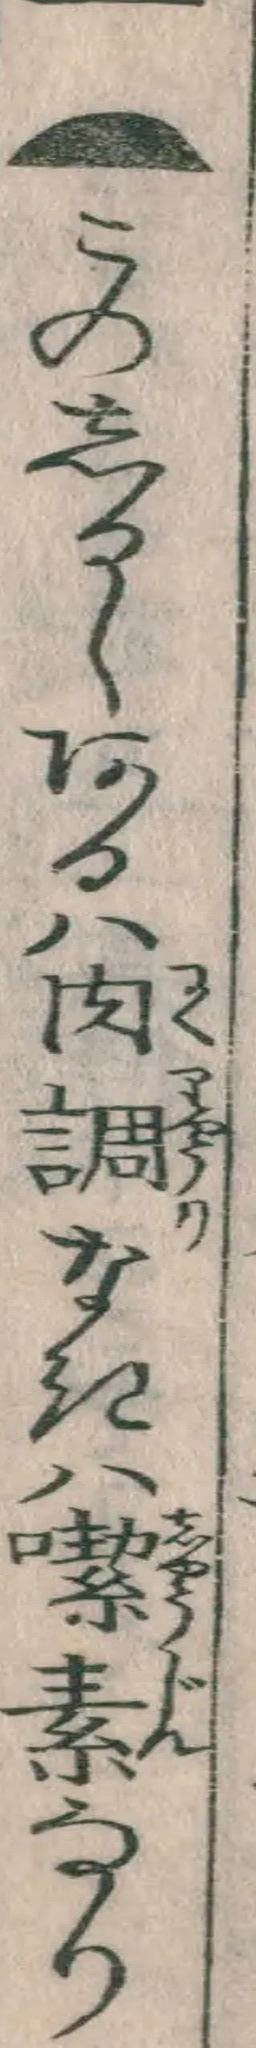一●このしるしあるは肉調なきは噄素なり
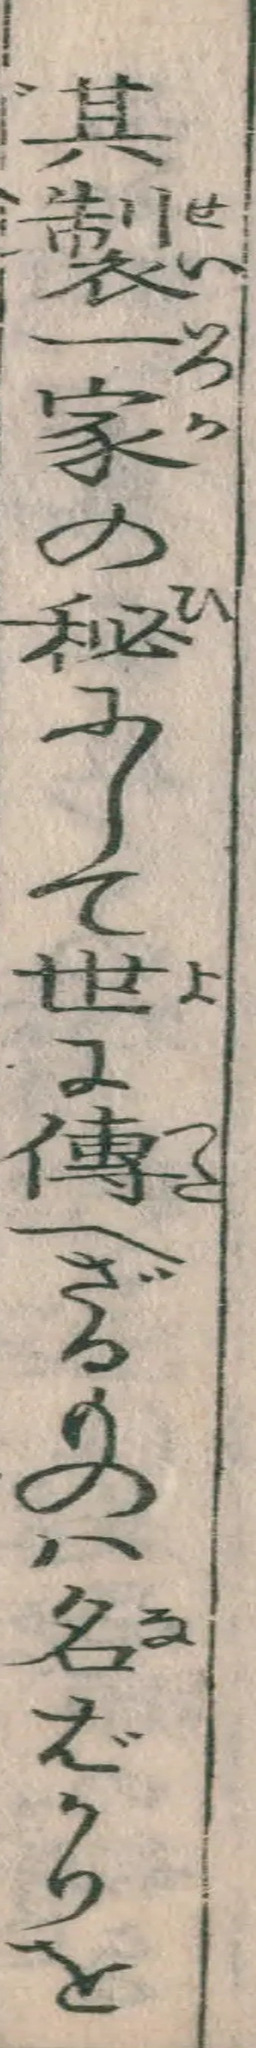一其製一家の秘にして世に伝へざるものは名ばかりを
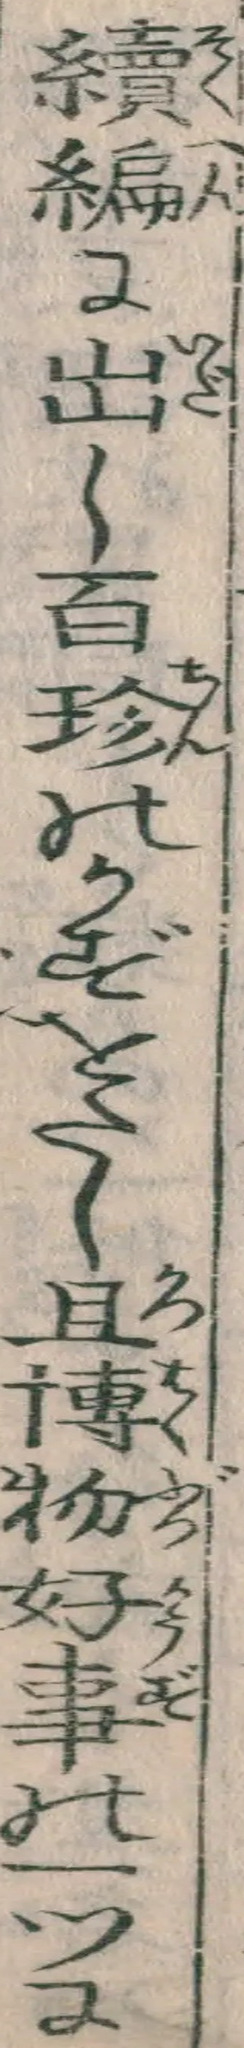続編に出し百珍のかずをたし且博物好事の一ツに
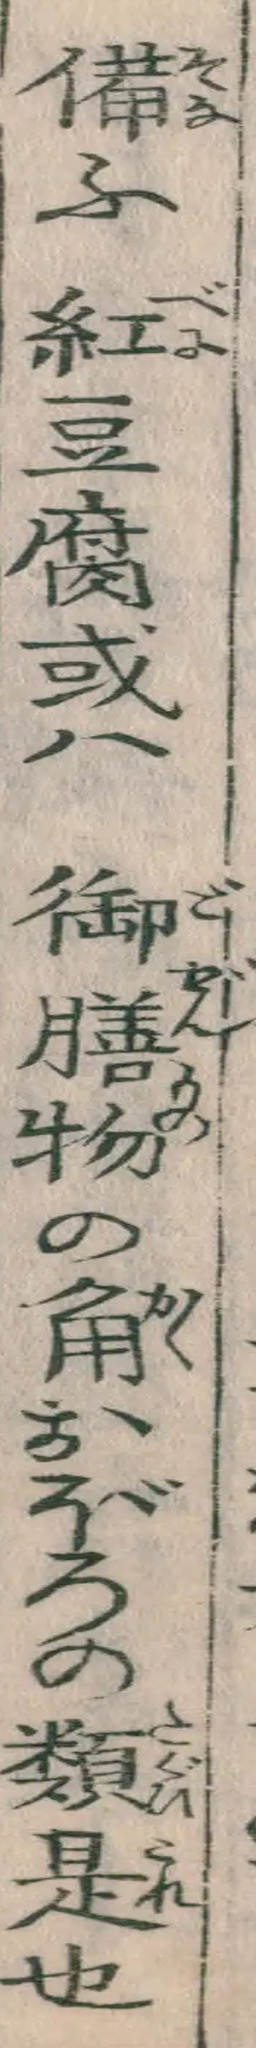備ふ紅豆腐或は御膳物の角おぼろの類是也
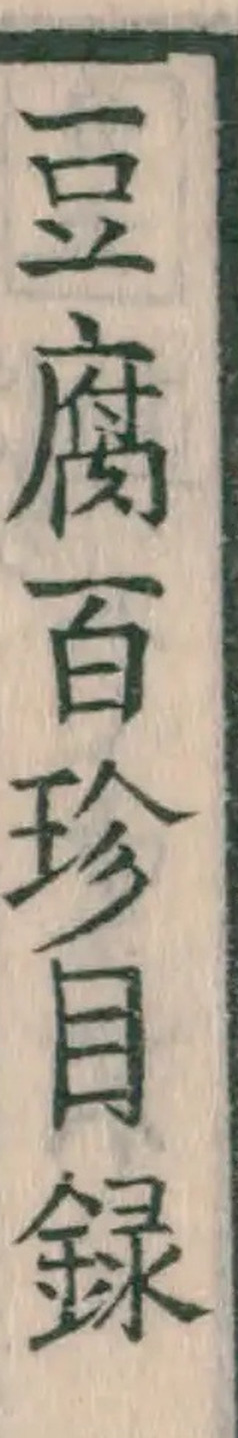豆腐百珍目録
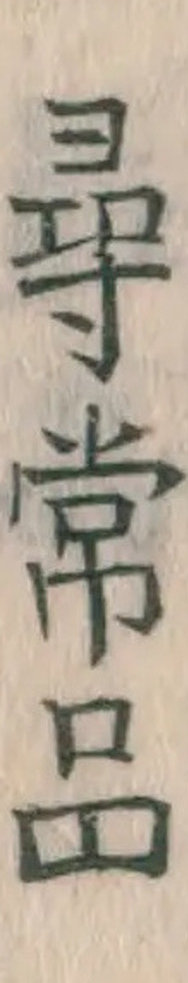尋常品

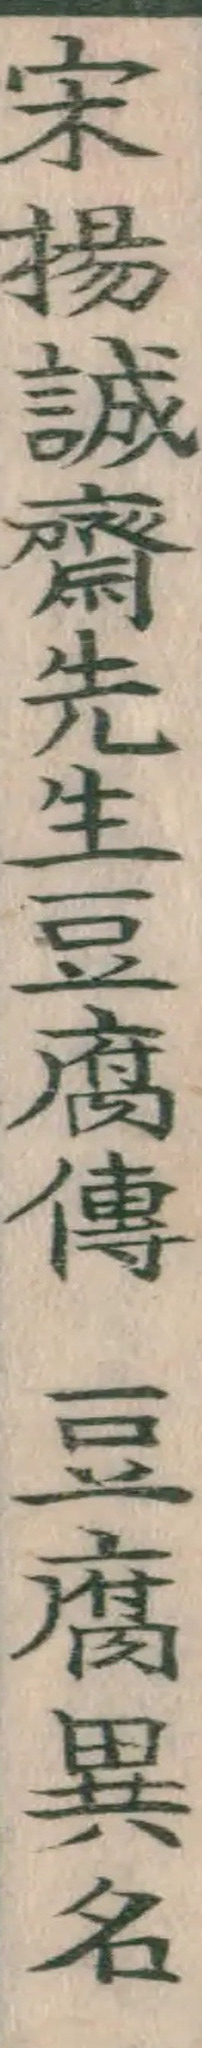宋揚誠斎先生豆腐伝豆腐異名

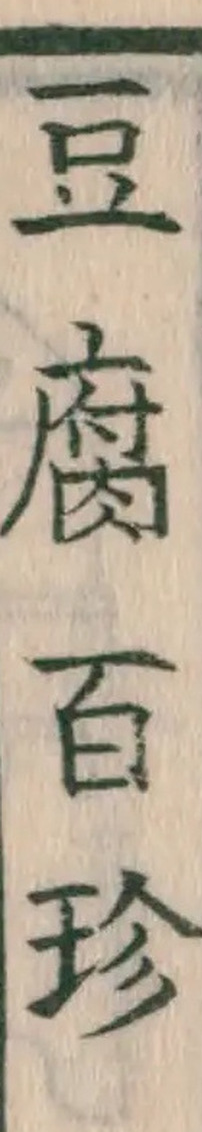豆腐百珍
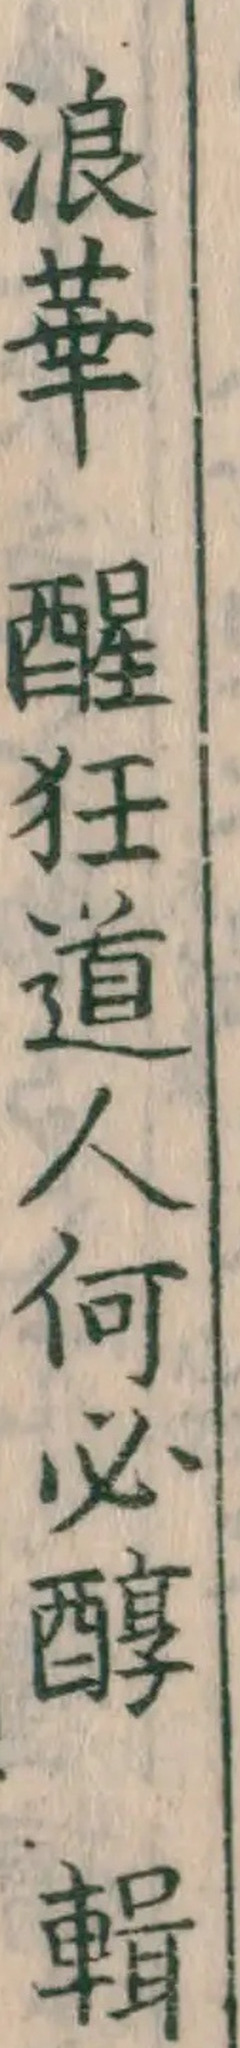浪華醒狂道人何必醇輯
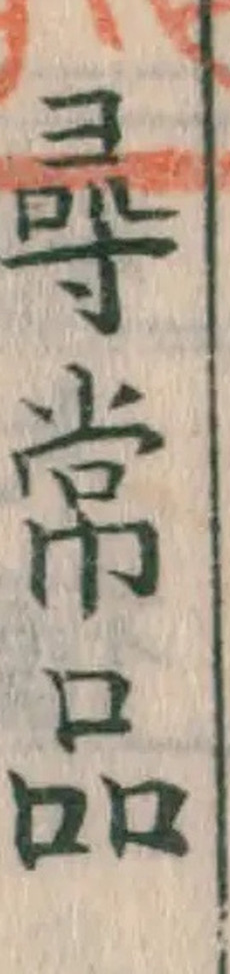尋常品
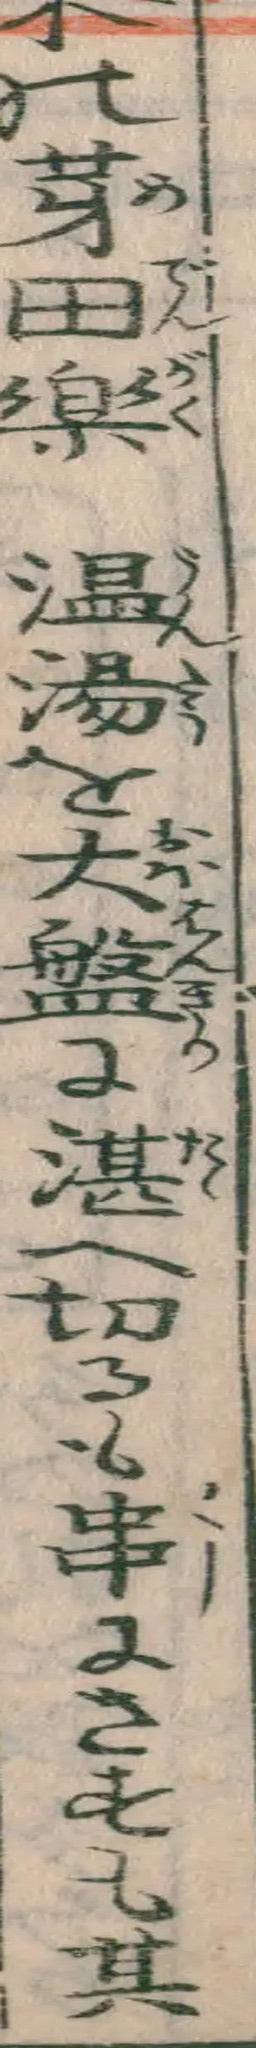[一]木の芽田樂温湯を大盤に湛へ切るも串にさすも其
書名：豆腐百珍. [正編]
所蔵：国立国会図書館 National Diet Library, JAPAN
